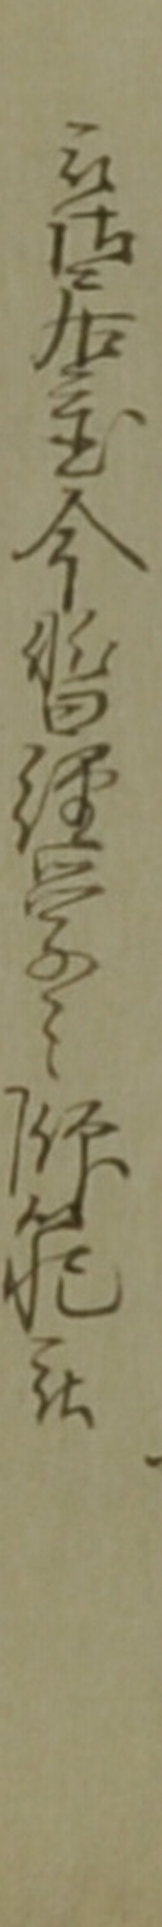被御居置今暫経学之師範被
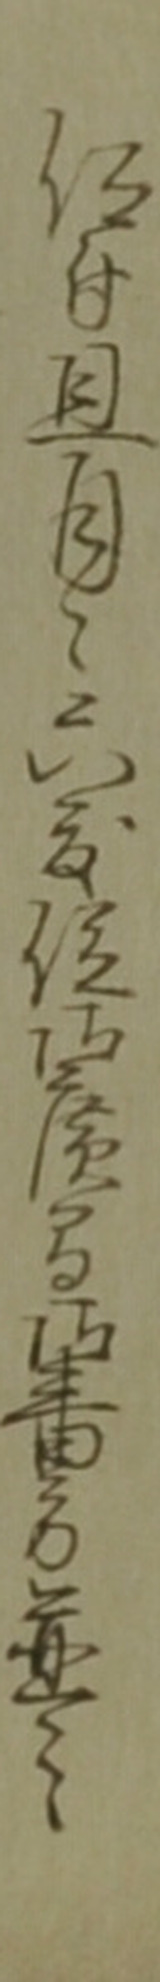仰付且月々六度従御広間御番方並之
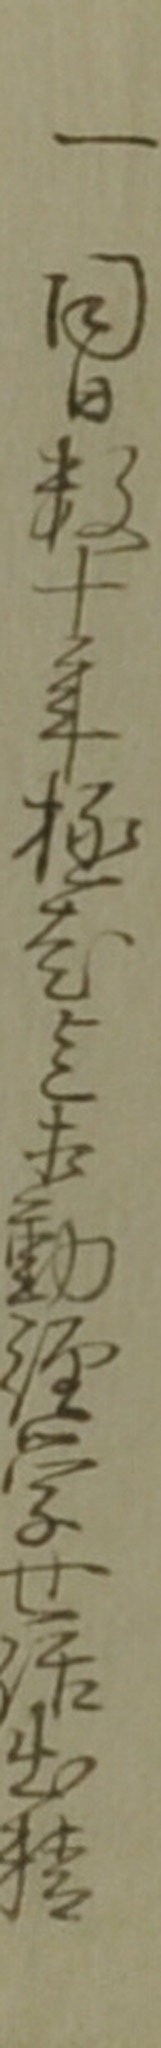一同日数十年極老迄相勤経学世話出精
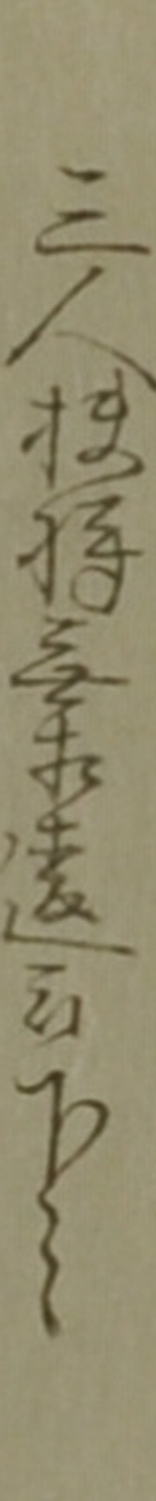三人扶持無相違被下之
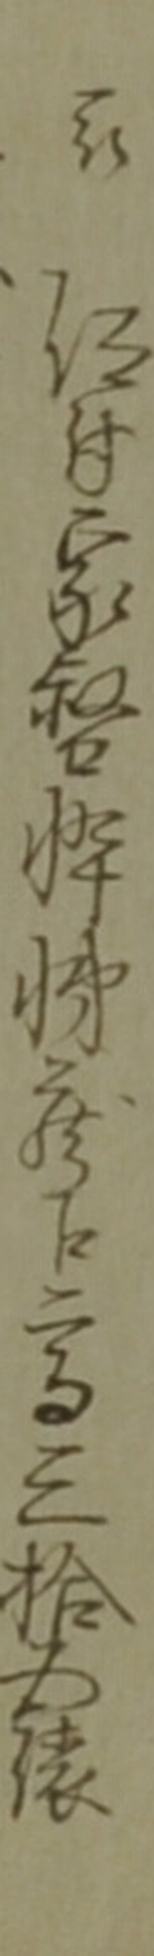被仰付家督忰悌蔵江高三拾五俵
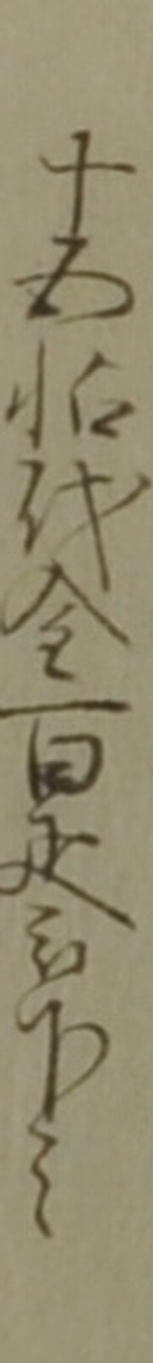十五帖代金百疋被下之
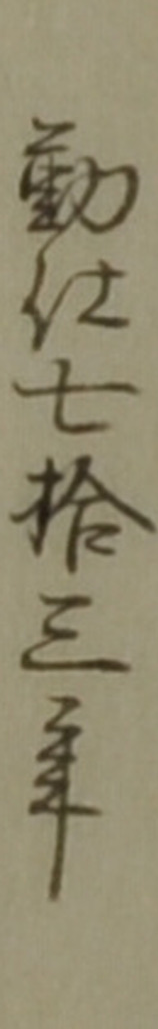勤仕七拾三年
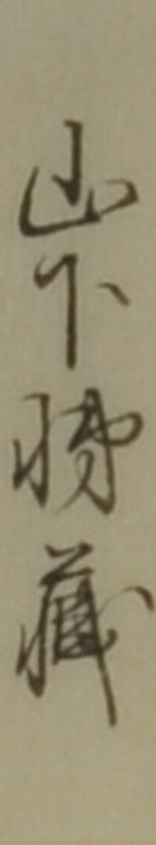山下悌蔵
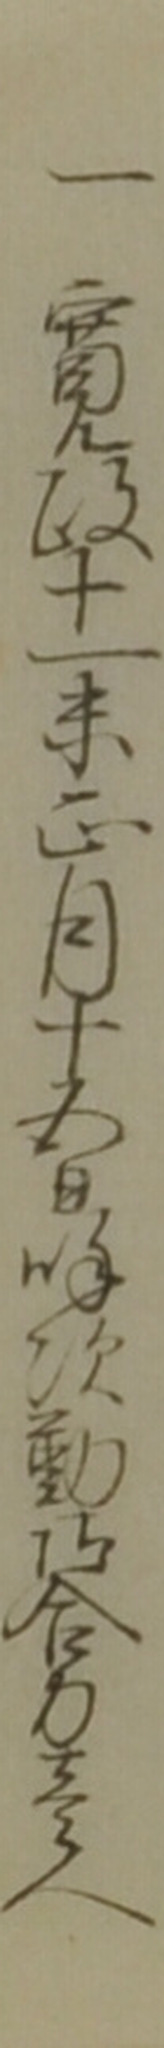一寛政十一未正月十五日呼次勤御合力壱人
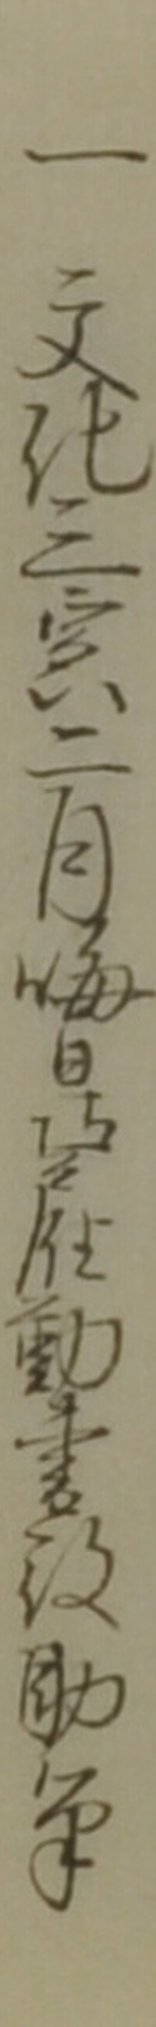一文化三寅二月晦日御雇勤書役助筆
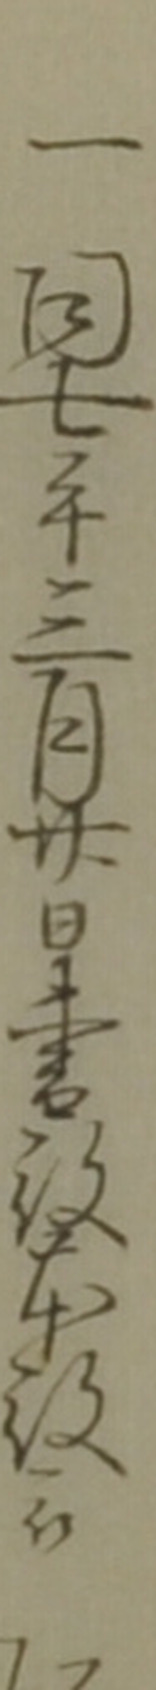一同七午三月廿日書役本役被仰付
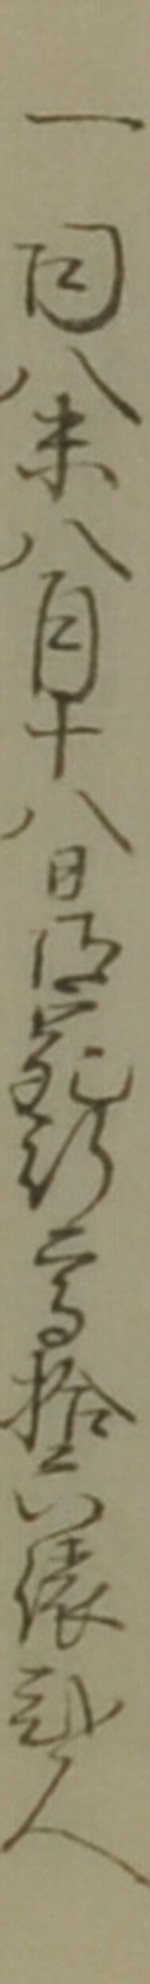一同八未八月十八日御宛行高拾六俵弐人
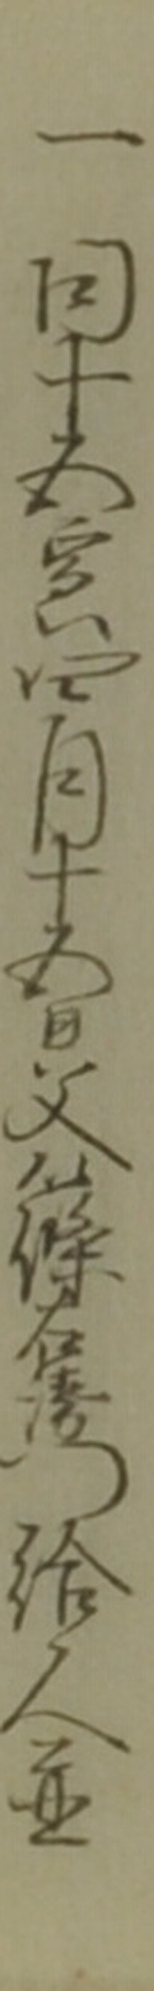一同十五寅四月十五日父篠右衛門給人並
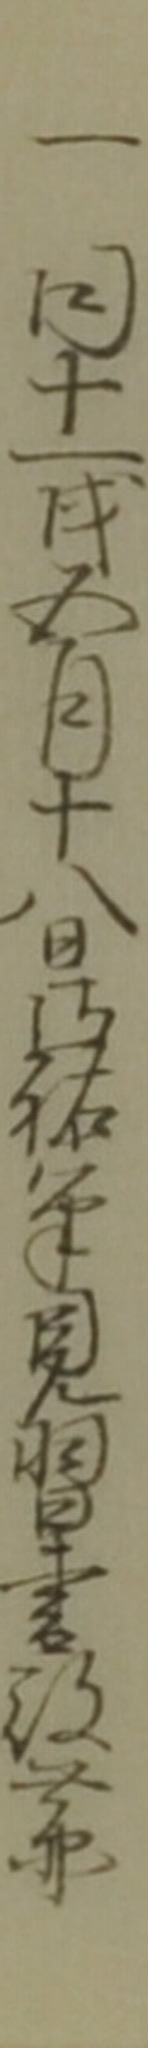一同十一戌五月十八日御祐筆見習書役兼
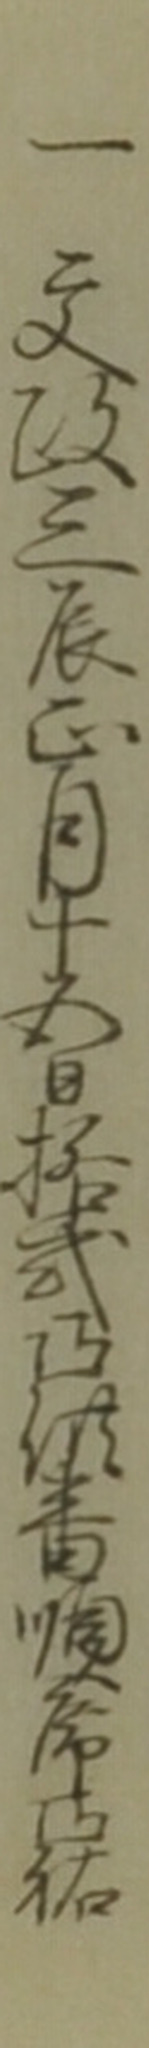一文政三辰正月十五日格式御供番順席御祐
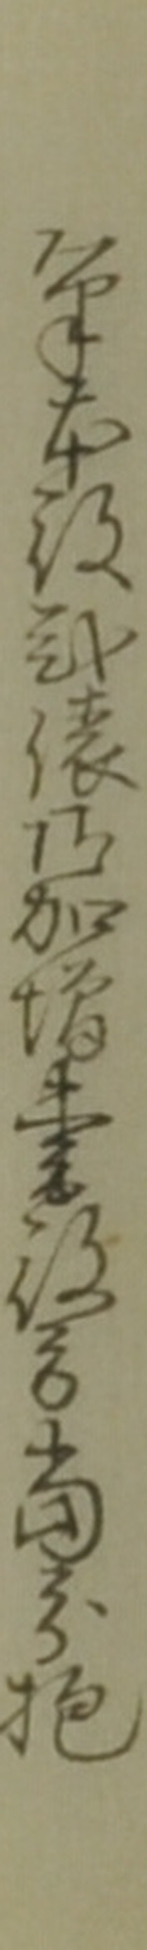筆本役弐俵御加増書役方当分抱
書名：無足廃家（弐）
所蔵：伊那市立高遠町図書館・合同会社AMANE
